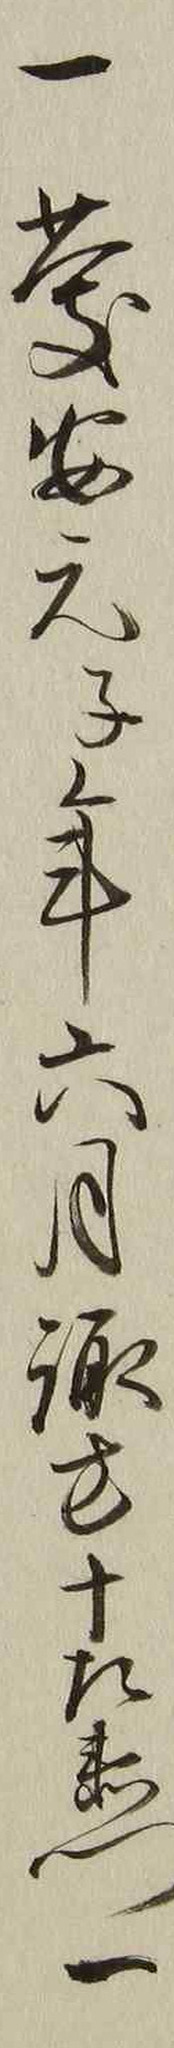一慶安元子年六月諏方十左衛門一
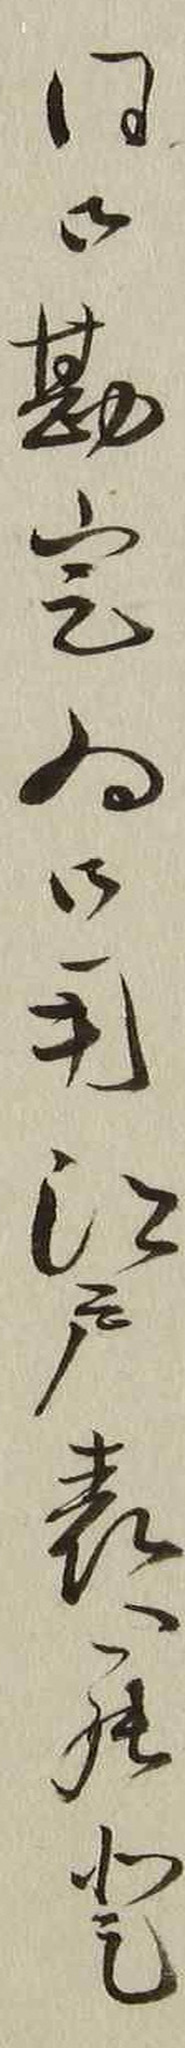同御勘定為御用江戸表ㇸ罷登
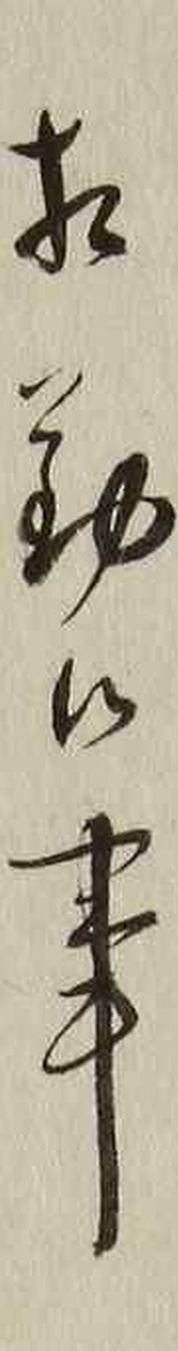相勤候事
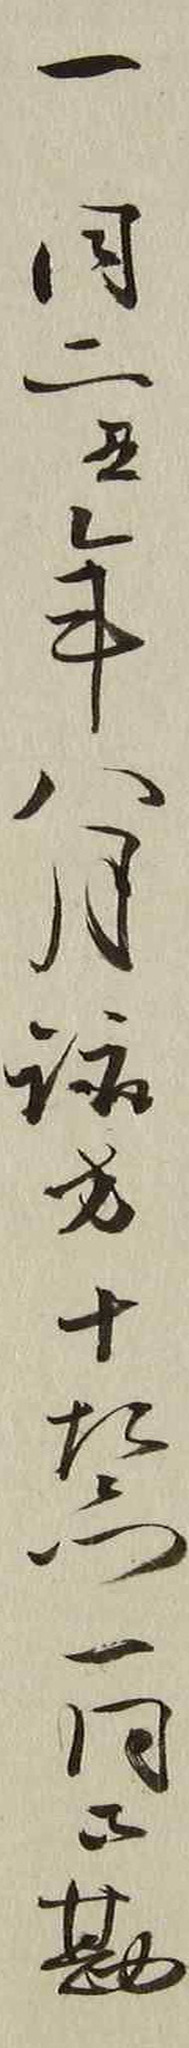一同二丑年八月諏方十左衛門一同御勘
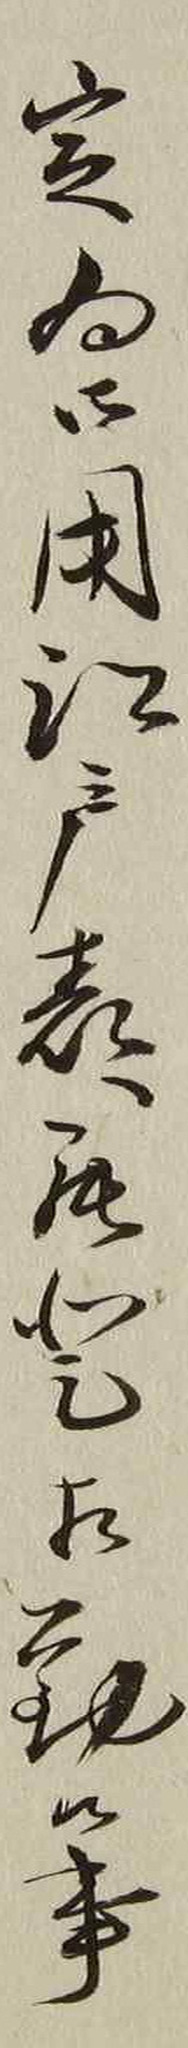定為御用江戸表ㇸ罷登相勤候事
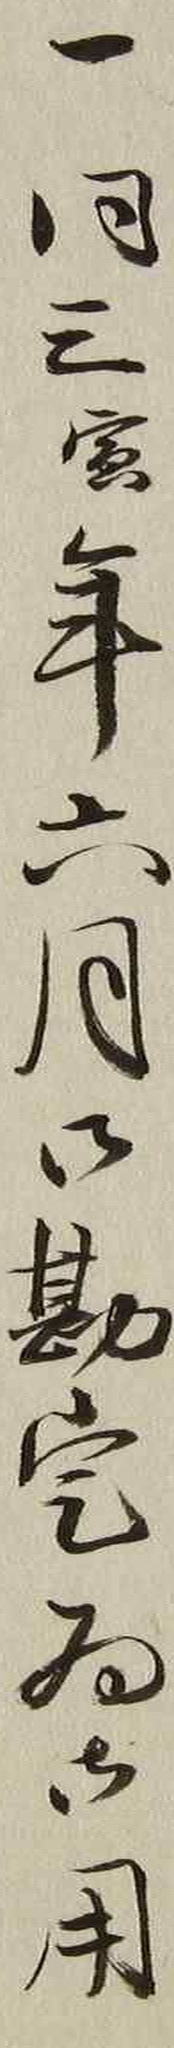一同三寅年六月御勘定為御用
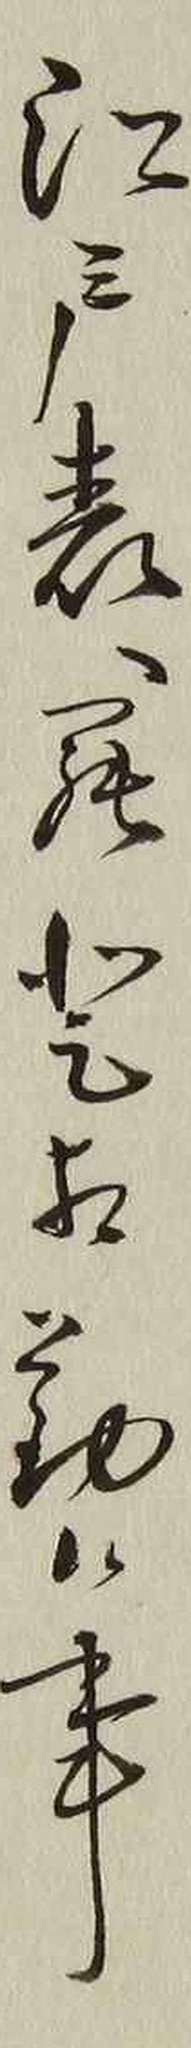江戸表ㇸ罷登相勤候事
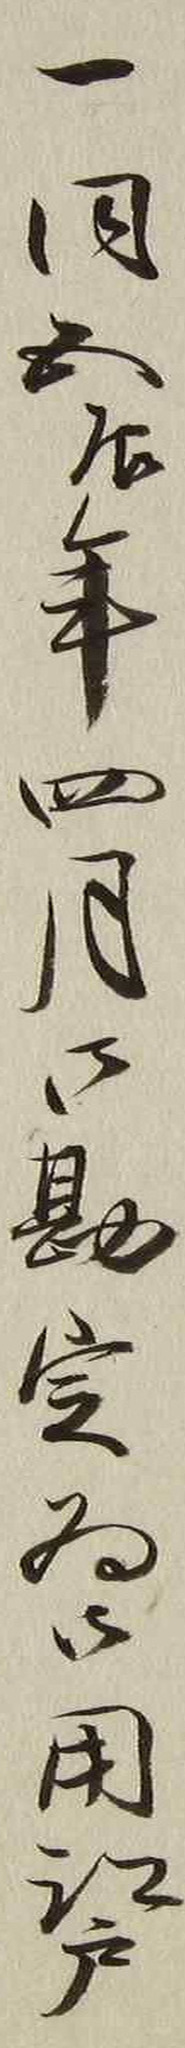一同五辰年四月御勘定為御用江戸
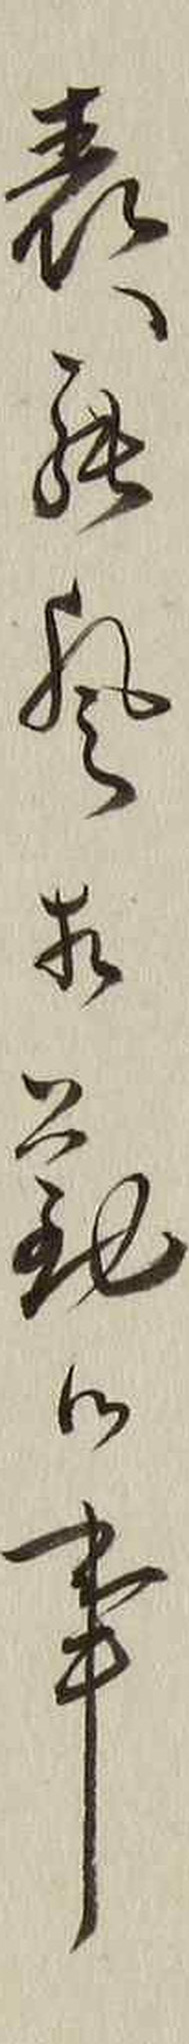表ㇸ罷登相勤候事
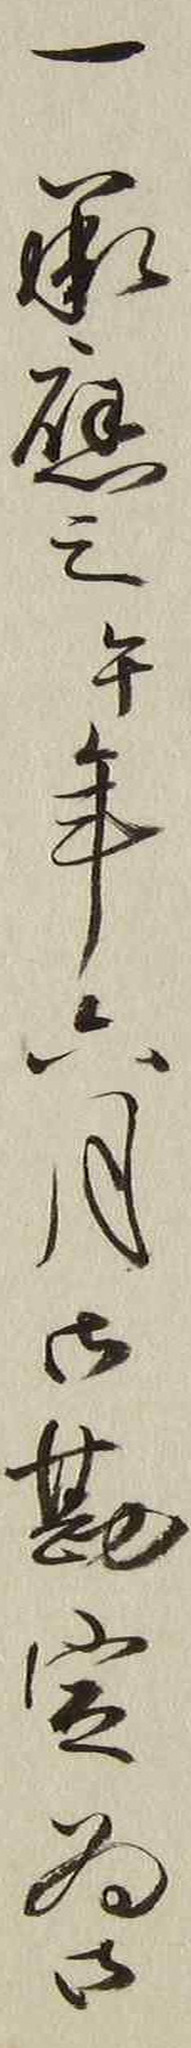一承応三午年六月御勘定為御
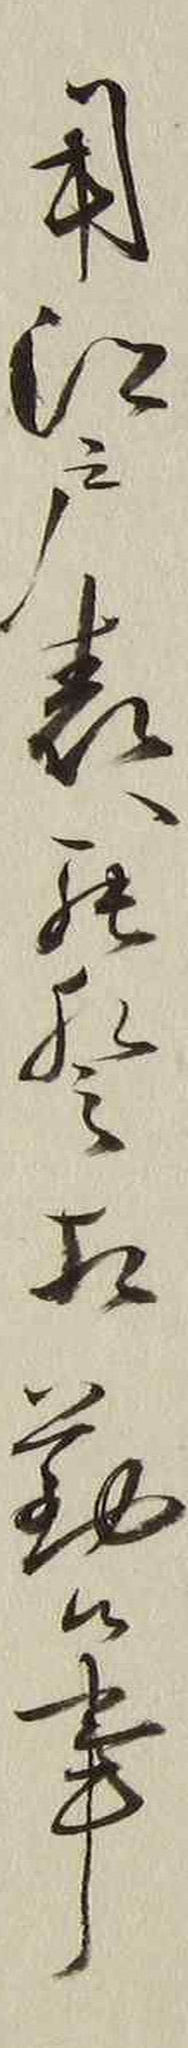用江戸表ㇸ罷登相勤候事
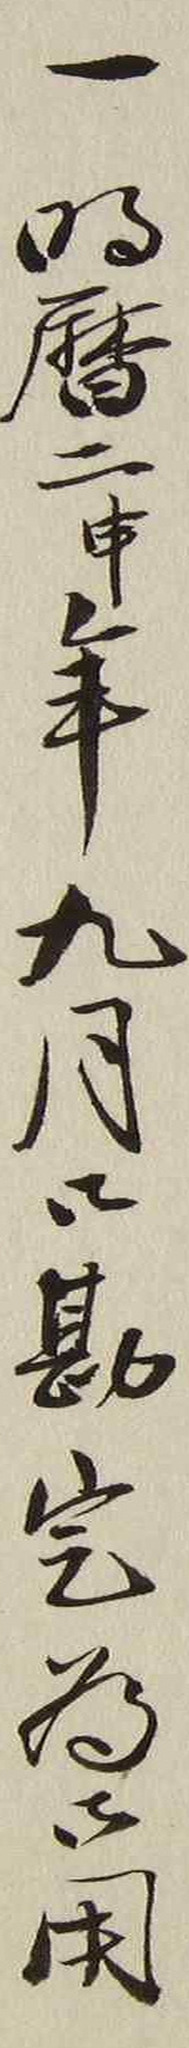一明暦二申年九月御勘定為御用
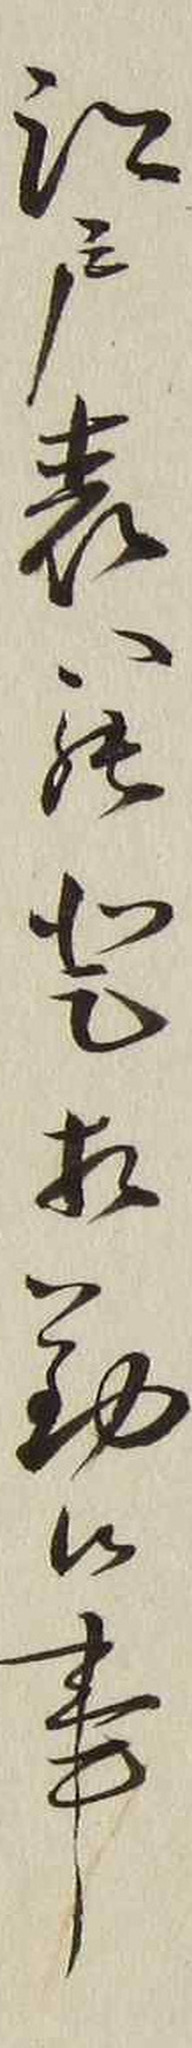江戸表ㇸ罷登相勤候事
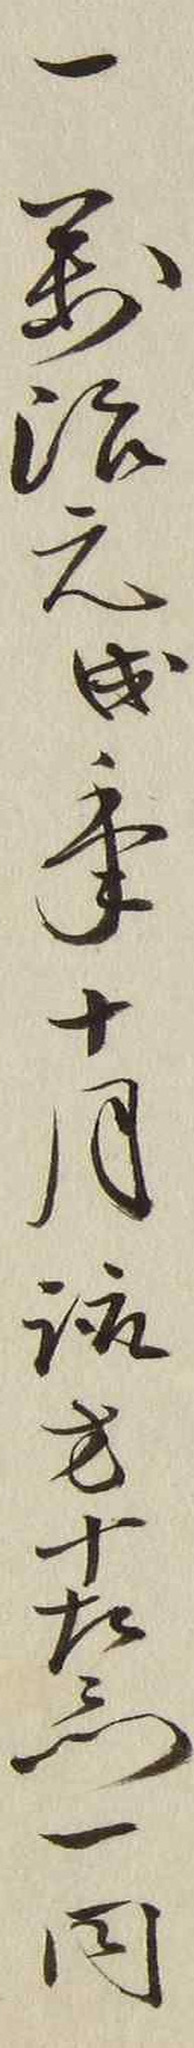一万治元戌年十月諏方十左衛門一同

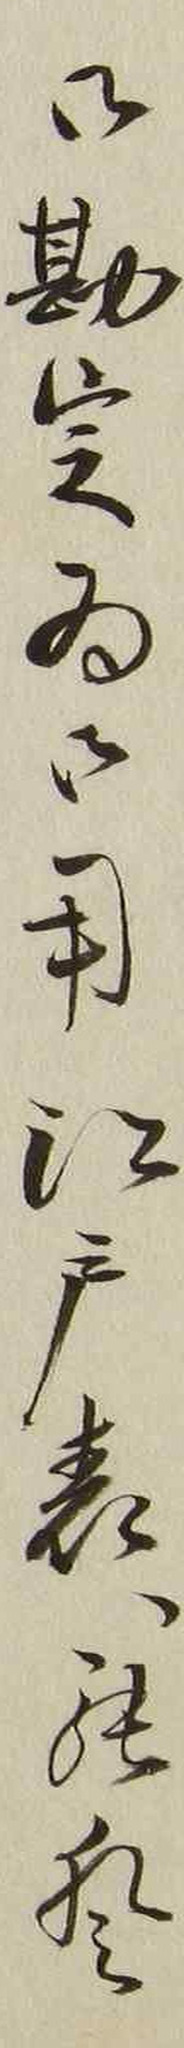御勘定為御用江戸表ㇸ罷登
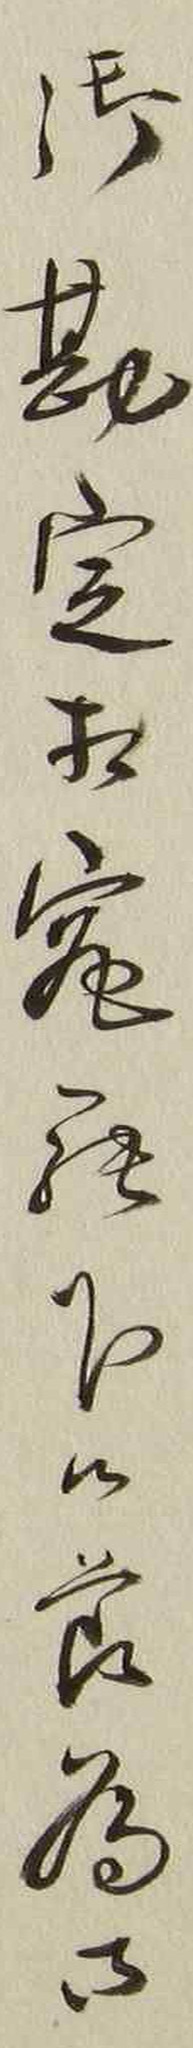御勘定相究罷下候節為御
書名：諸士系譜　巻之163　な之部5
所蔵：会津若松市立会津図書館
